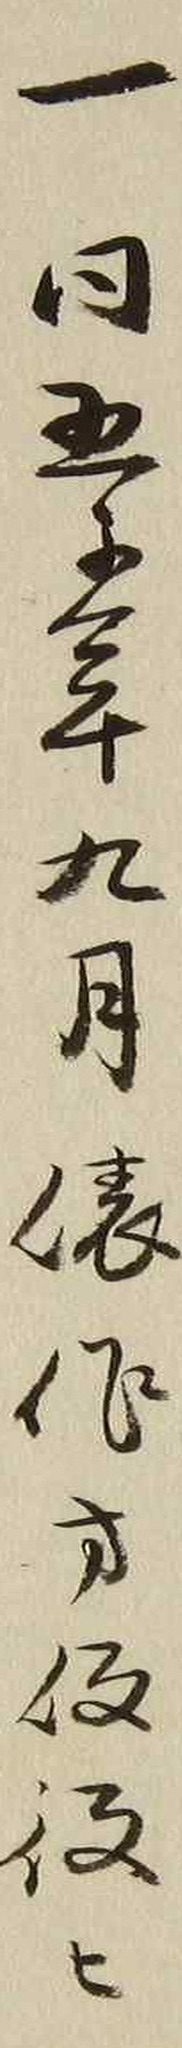一同五子年九月俵作方仮役被
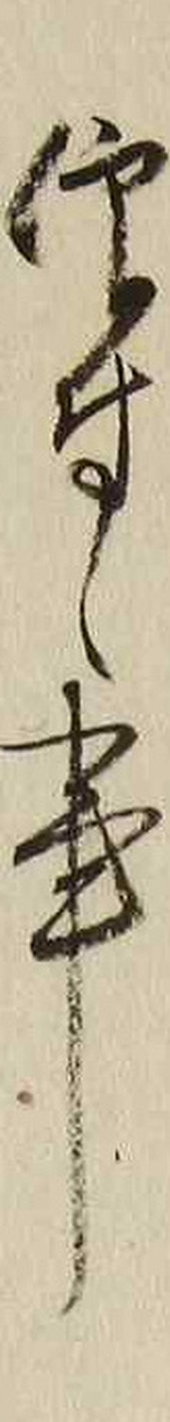仰付候事
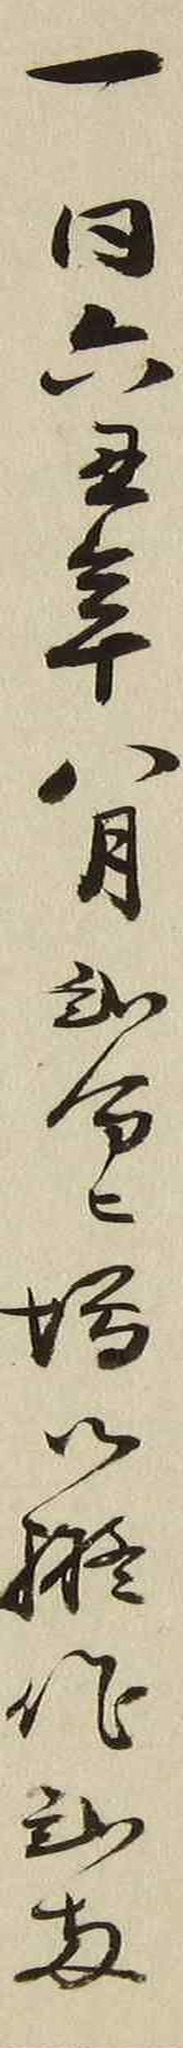一同六丑年八月弐分被増御擬作弐両
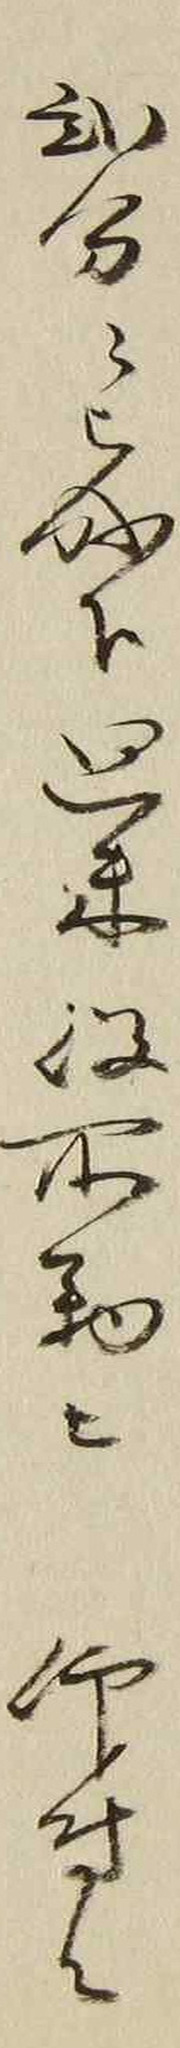弐分ニ被成下廻米役所勤被仰付候
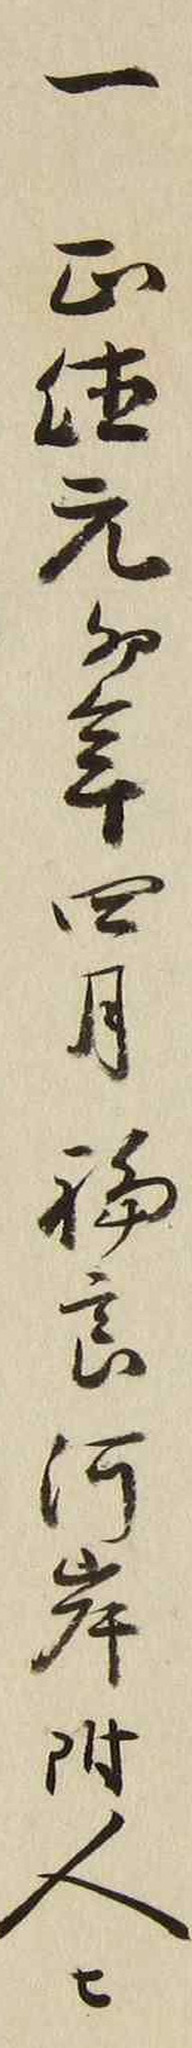一正徳元卯年四月福良河岸附人被
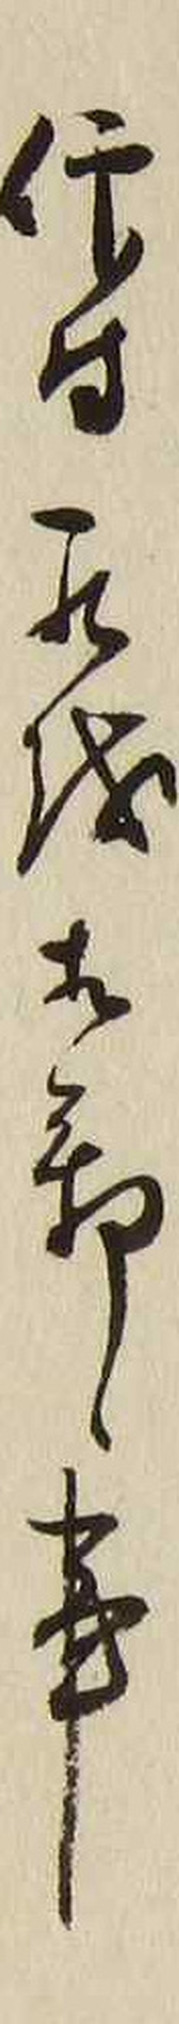仰付罷越相勤候事
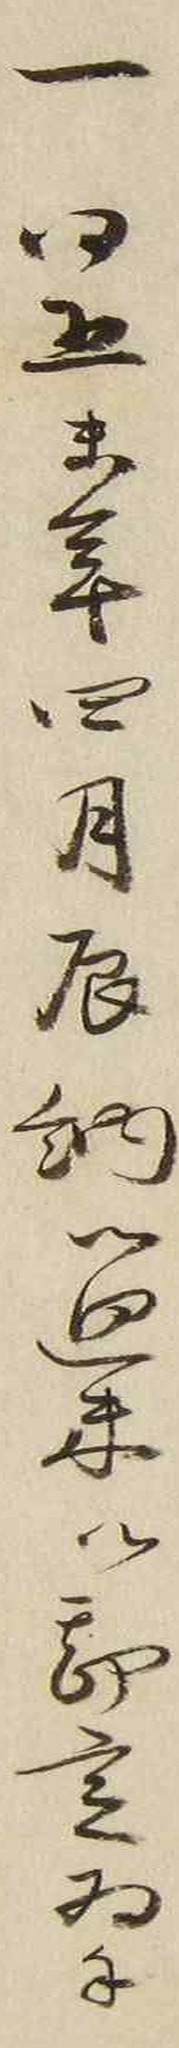一同五未年四月辰納御廻米御勘定為手

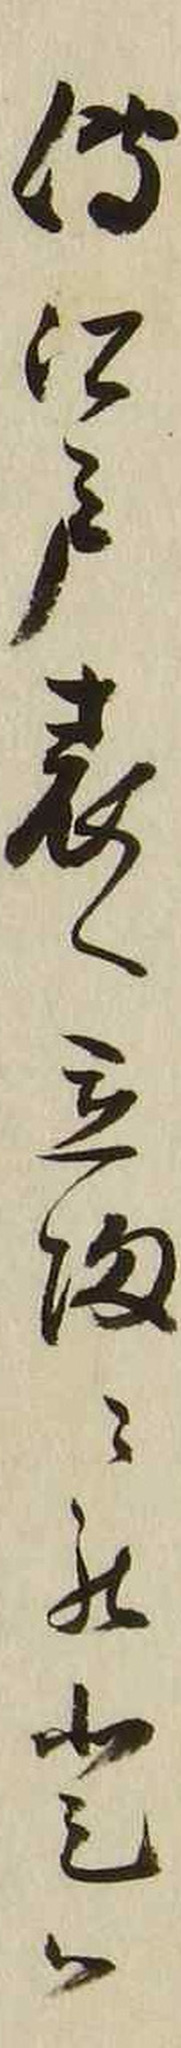伝江戸表へ立帰ニ罷登候
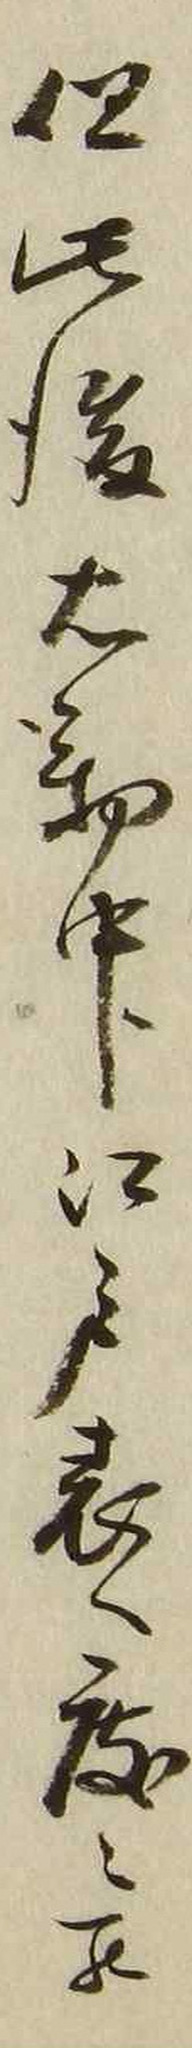但此後右勤中江戸表へ度々罷
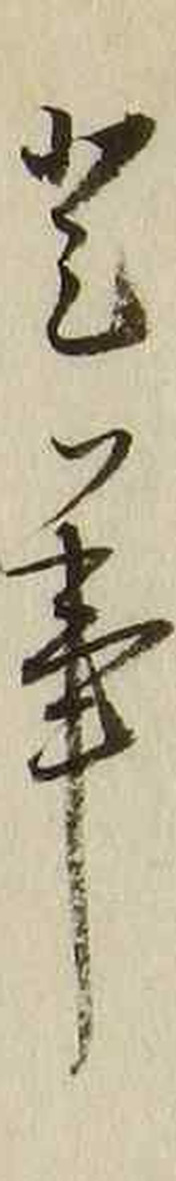登候事
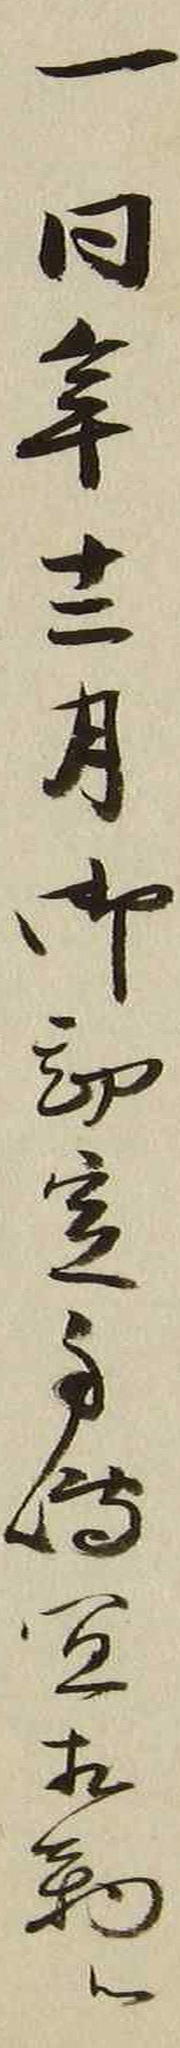一同年十二月御勘定手伝宜相勤候
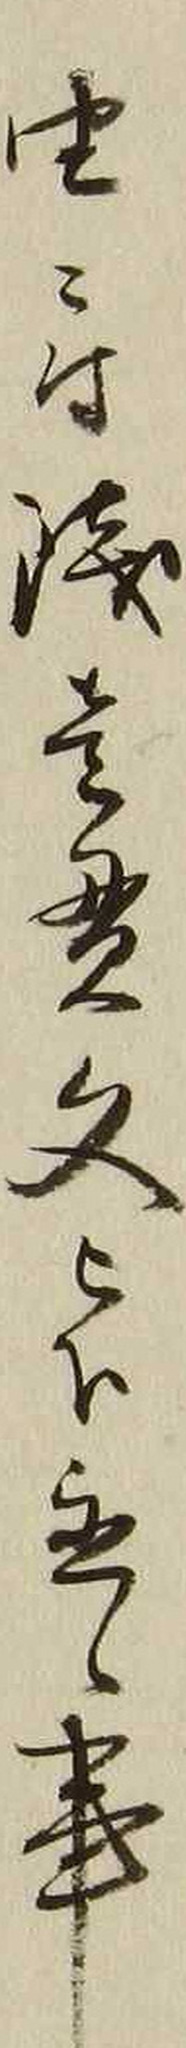由ニ付銭壱貫文被下置候事
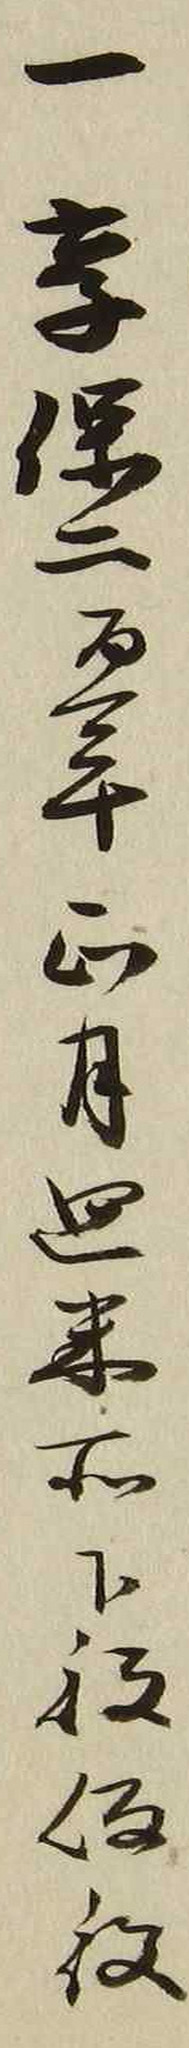一享保二酉年正月廻米所下役仮役
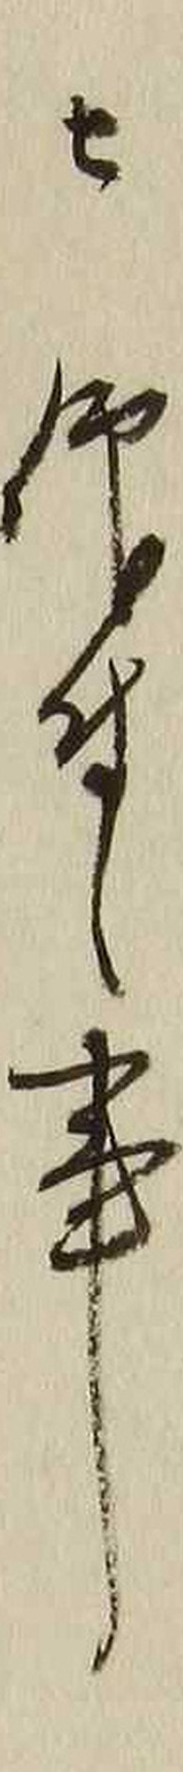被仰付候事
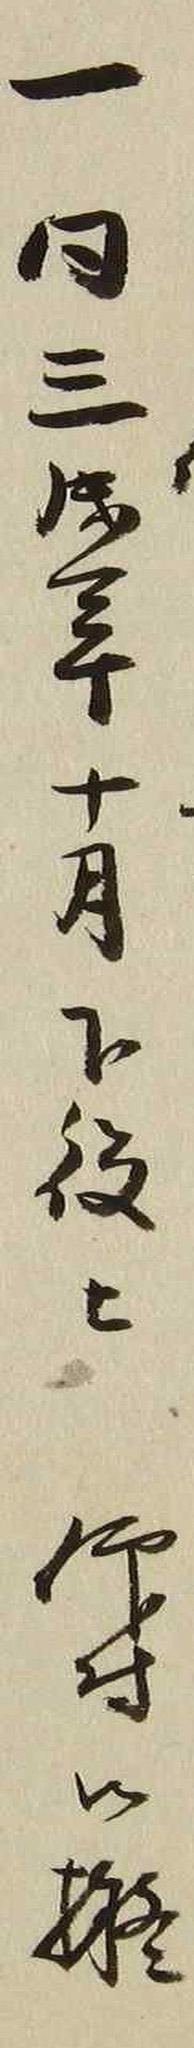一同三戌年十月下役被仰付御擬
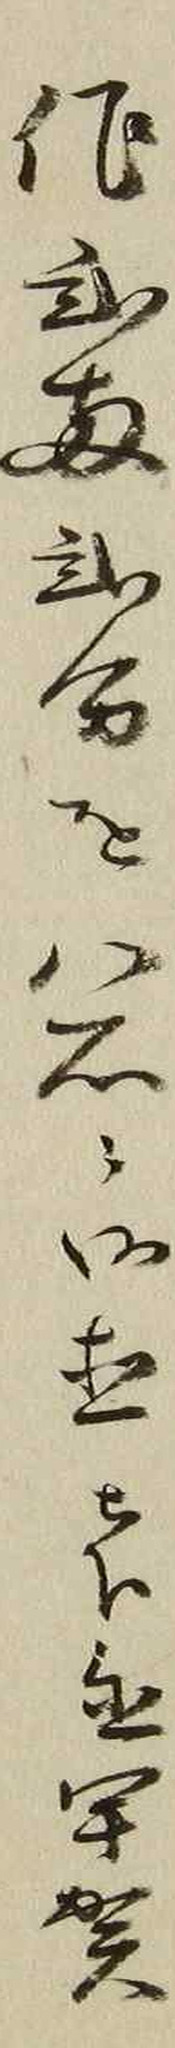作弐両弐分を八石ニ御直被下置甲賀
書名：諸士系譜　巻之288　さ之部20
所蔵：会津若松市立会津図書館
